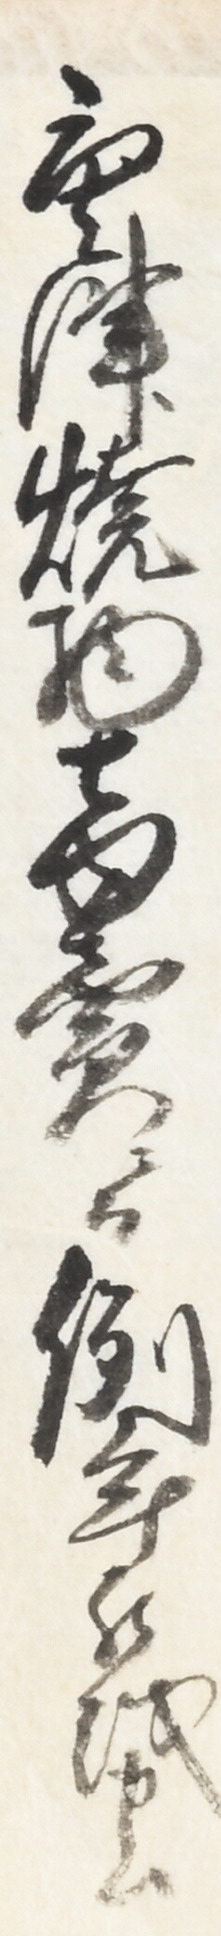唐津焼物商売ニ而例年罷越申候

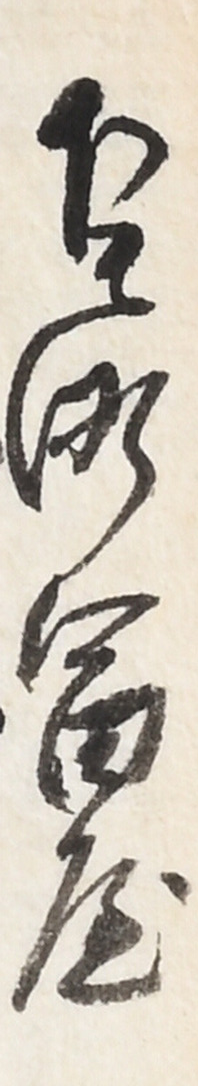下モ町冨屋
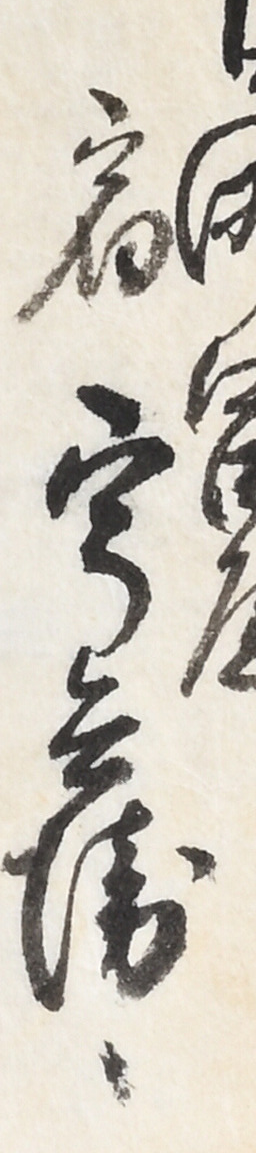宿宇兵衛
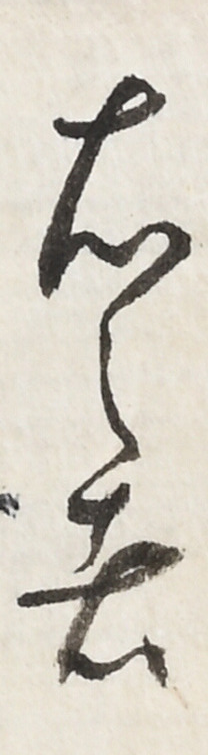右之者
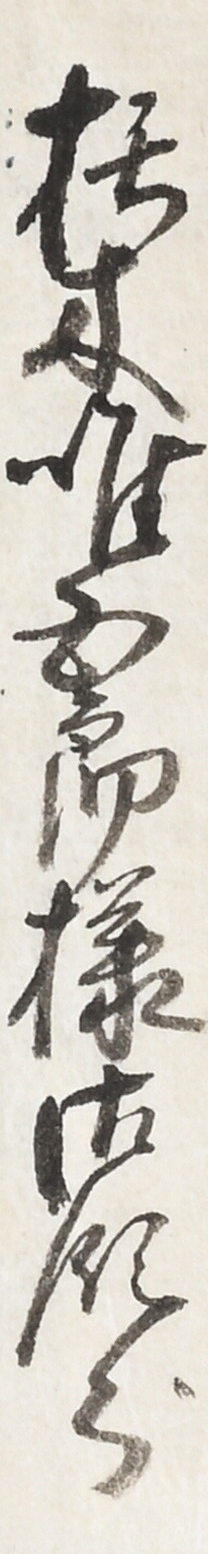朽木唯五郎様御領分
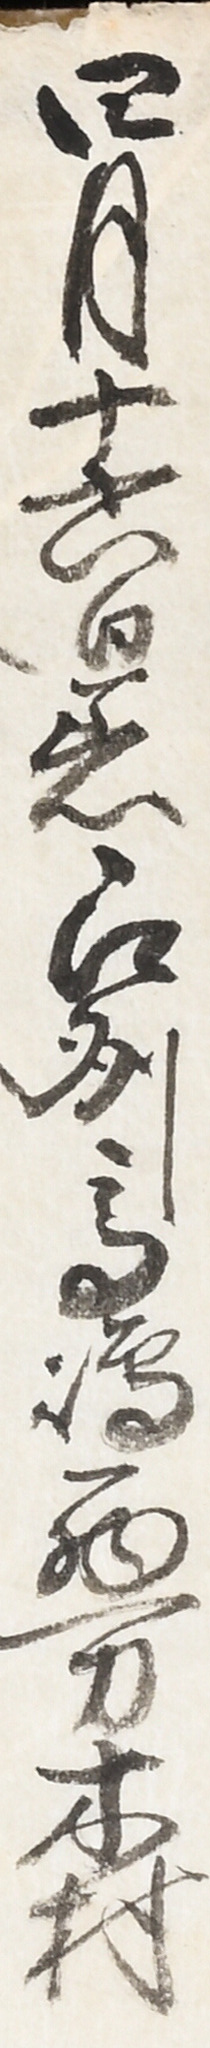四月十六日着江州高嶋西万木村
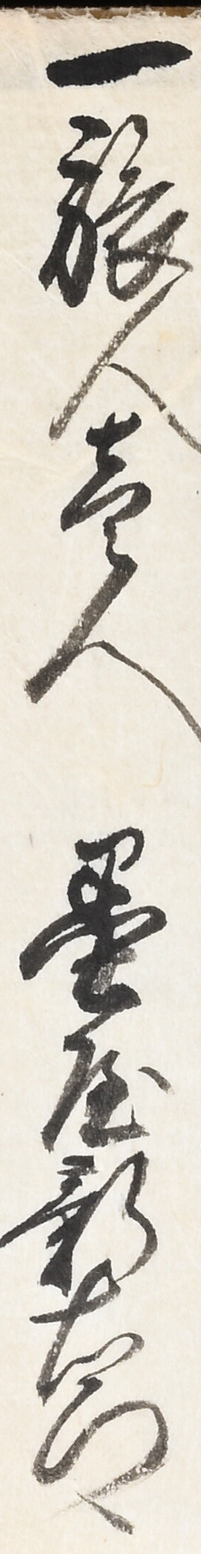一旅人壱人墨屋新右衛門・
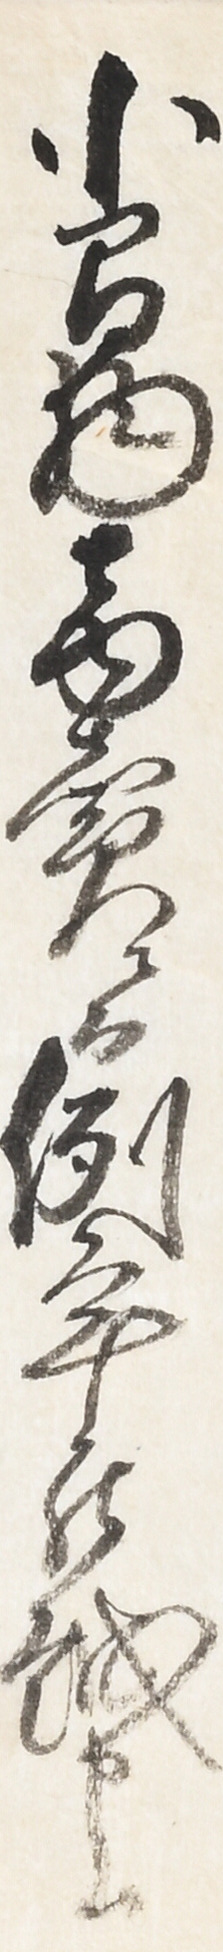小間物商売ニ而例年罷越申候
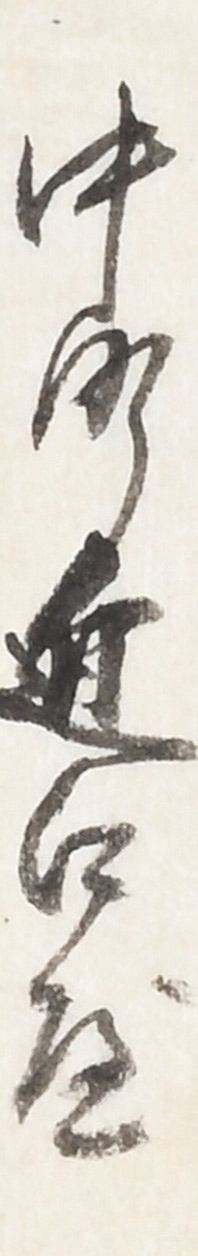中町近江屋
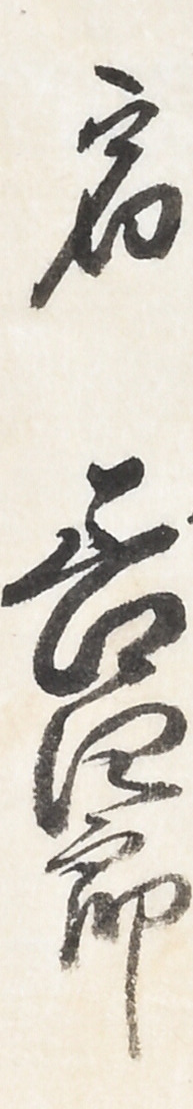宿善四郎
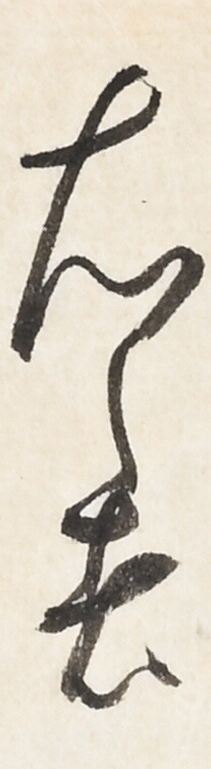右之者
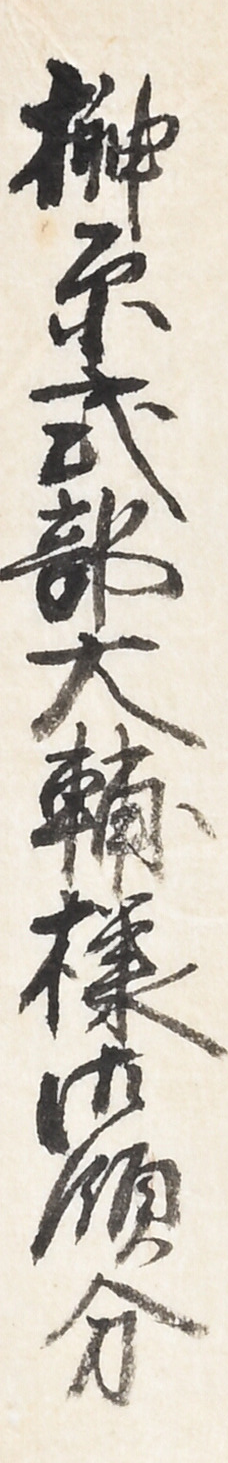榊原式部大輔様御領分
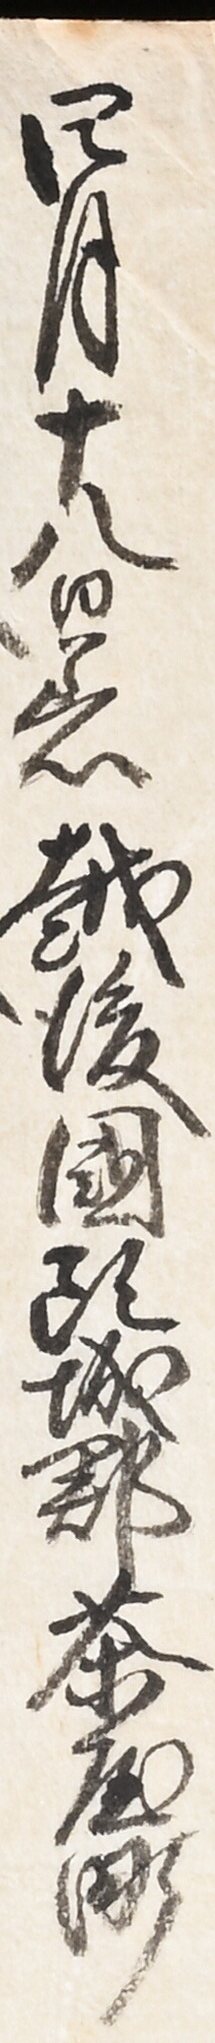四月十八日着越後国頸城郡茶屋町
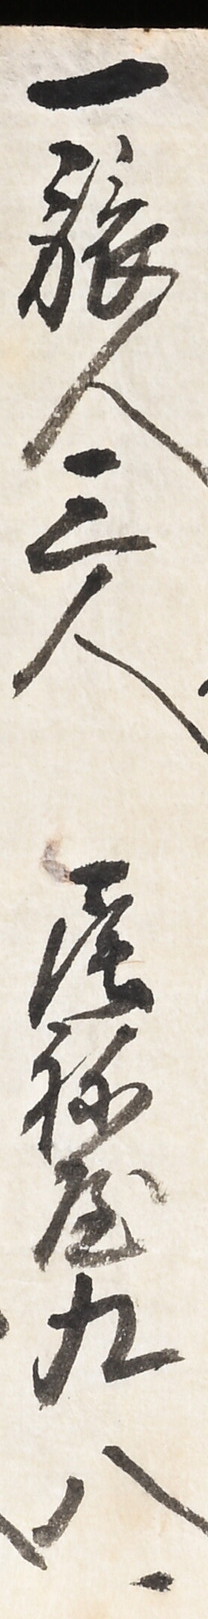一旅人三人尾祢屋九八
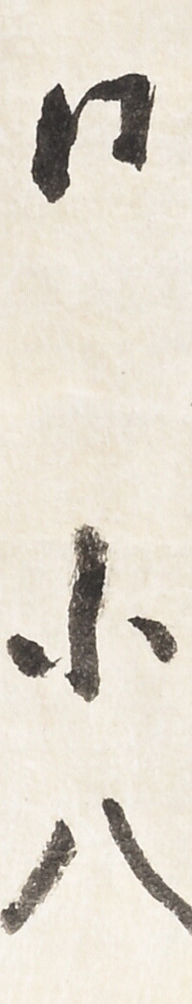同小八
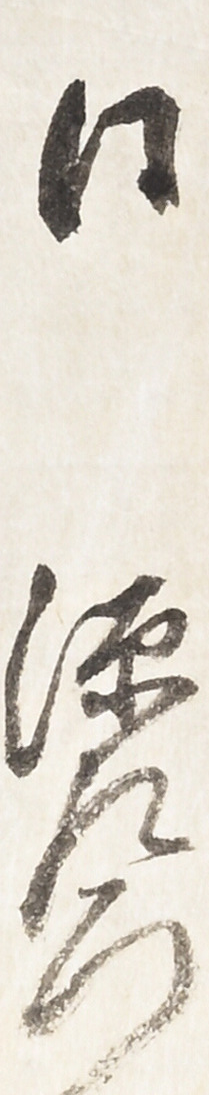同源左衛門
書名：旅人泊控帳
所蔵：伊那市立高遠町図書館・合同会社AMANE
